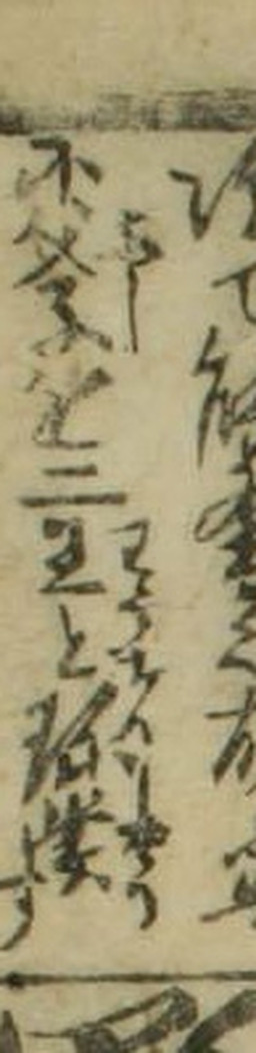に父子を二王と嘆賞す

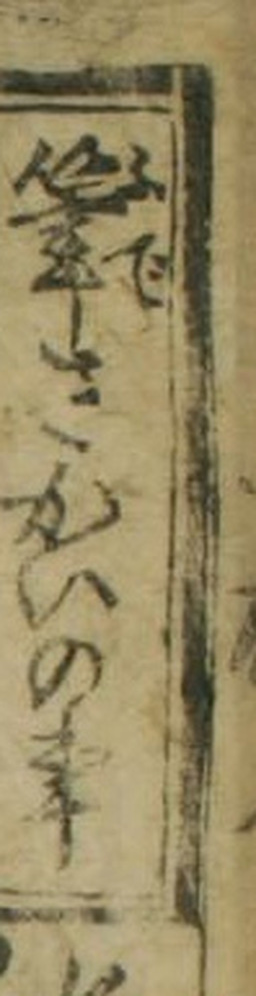筆さかいの事
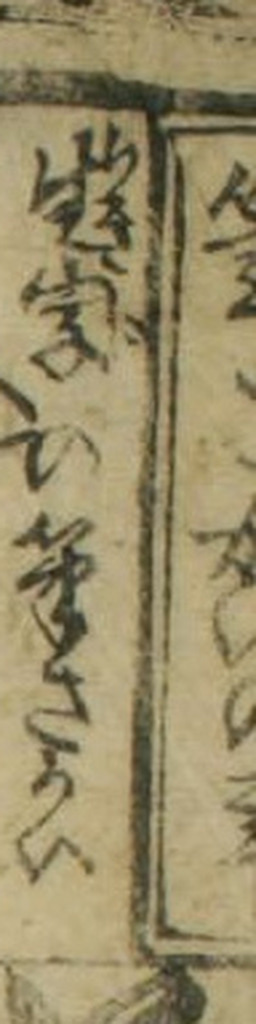生字の筆さかい
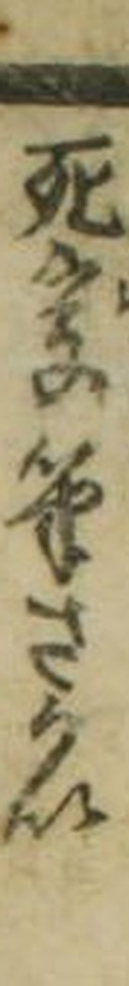死字筆さかい
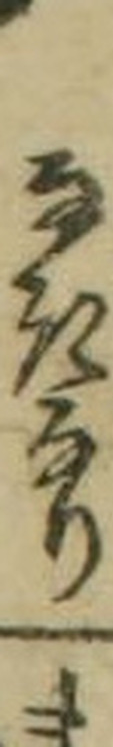なきなり
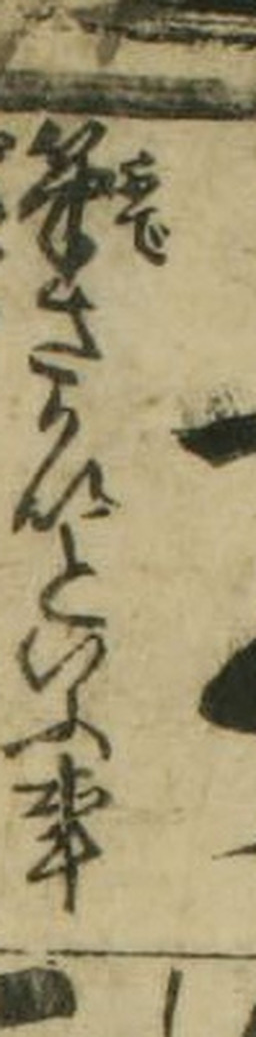筆さかいといふ事
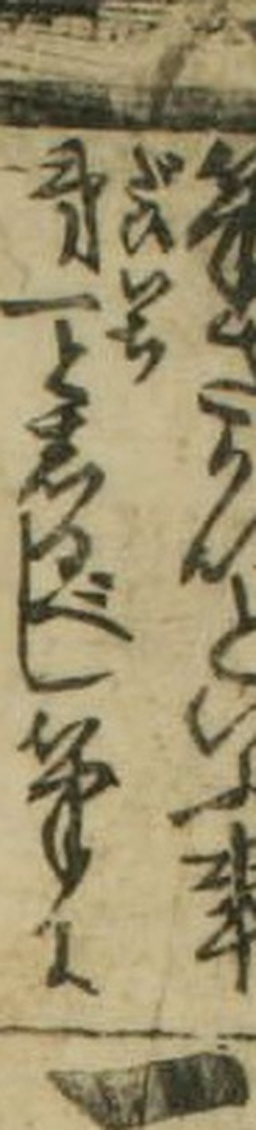第一としるべし筆に
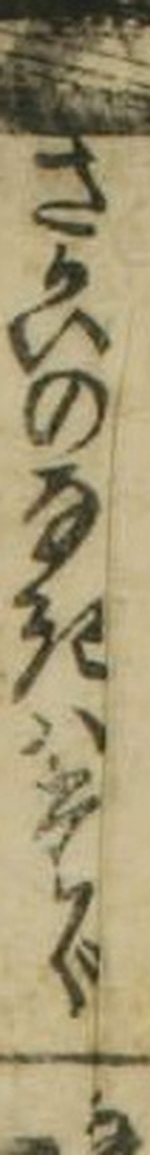さかいのなきはたゞ
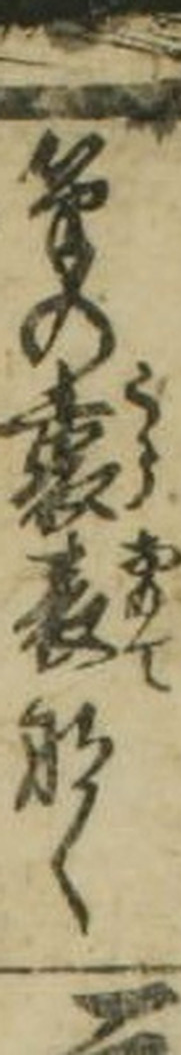筆の裏表なく
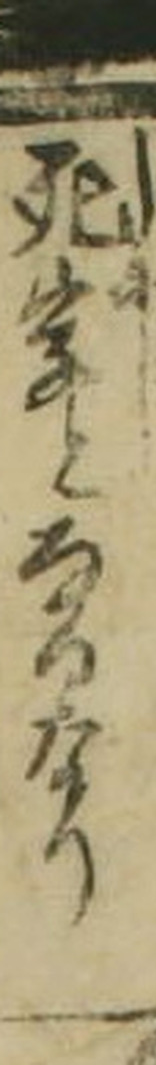死字となるなり
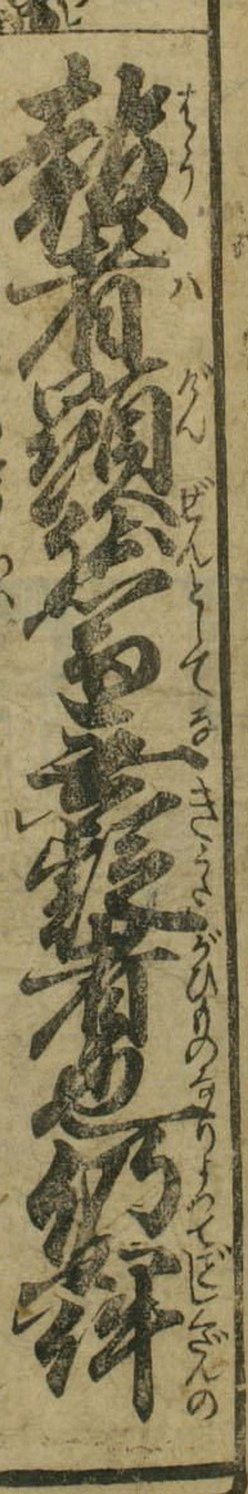報者顕然而無疑者也仍如件
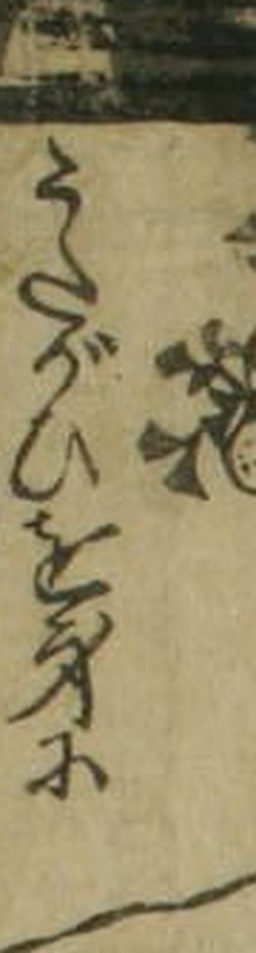うたがひを身に
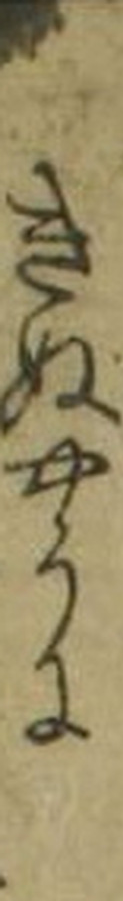きぬやうに
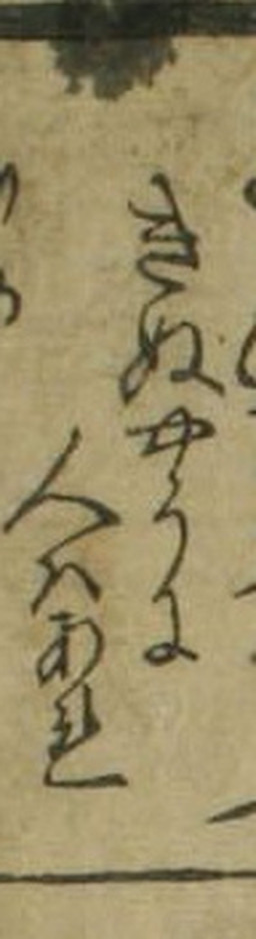人はあれ
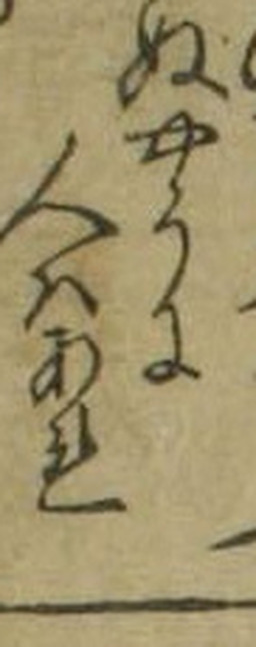人はあれ
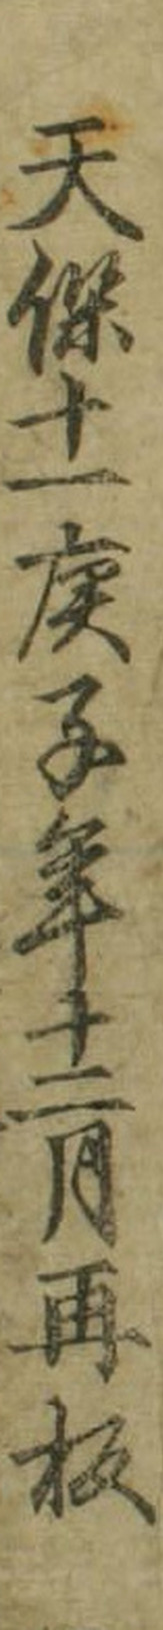天保十一庚子年十二月再板
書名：増補職人往来
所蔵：東京学芸大学教育コンテンツアーカイブ
